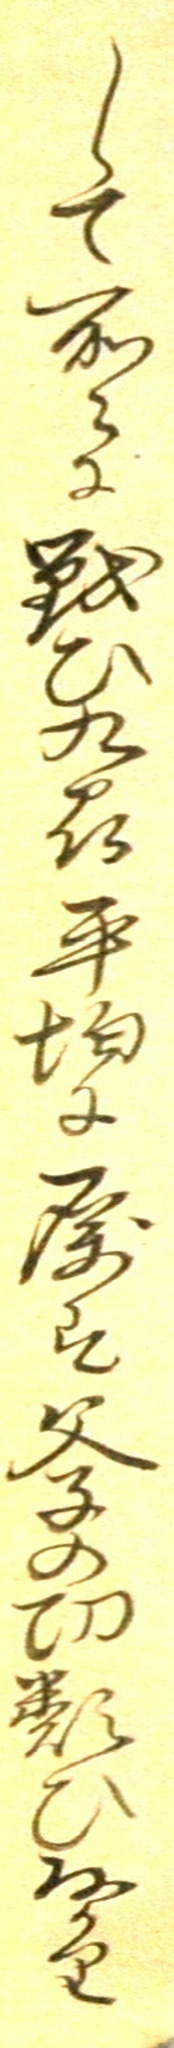して所々に戦ひ九州平均に属す父子の功類ひなかり

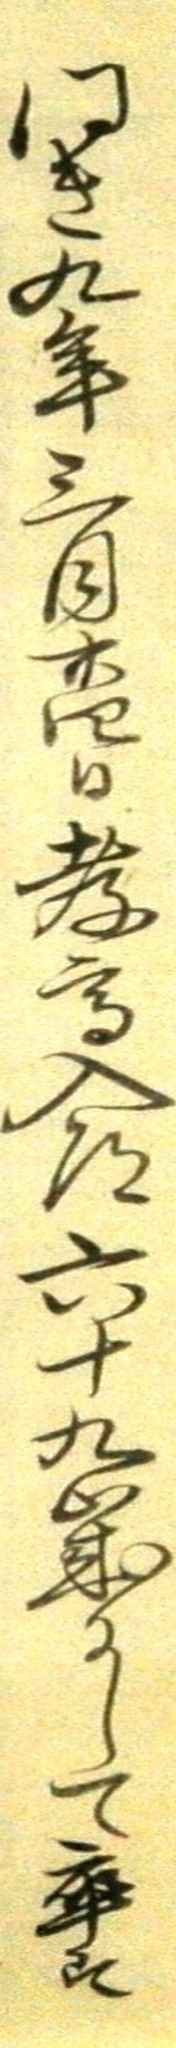同き九年三月廿四日孝高入道六十九歳にして卒す
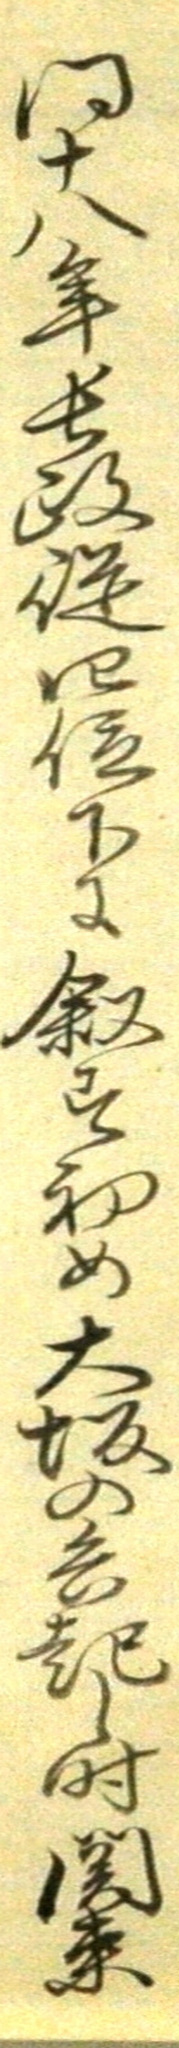同十八年長政従四位下に叙す初め大坂の兵起し時関東
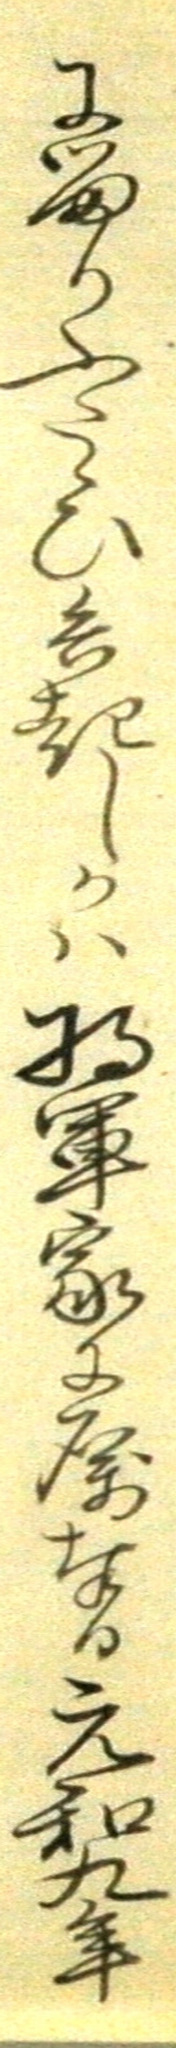に留りふたゝひ兵起しかは将軍家に属奉る元和九年
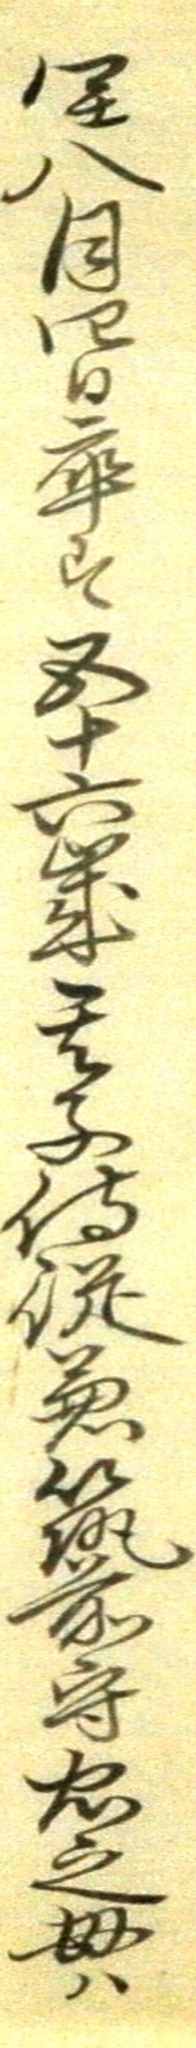閏八月四日卒す五十六歳其子侍従兼筑前守忠之母は
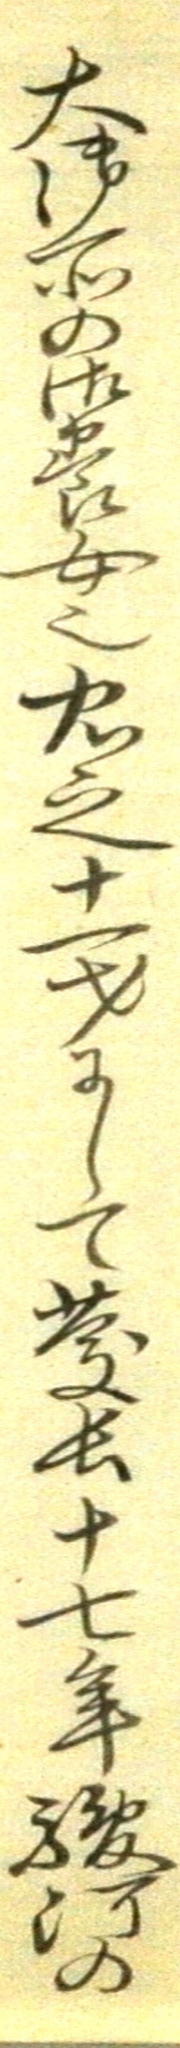大御所の御養女也忠之十一才にして慶長十七年駿河の
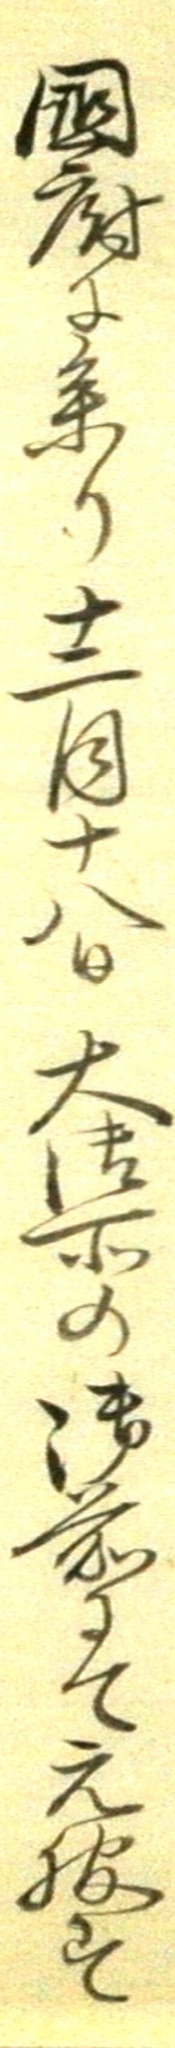国府に参り十二月十八日大御所の御前にて元服す
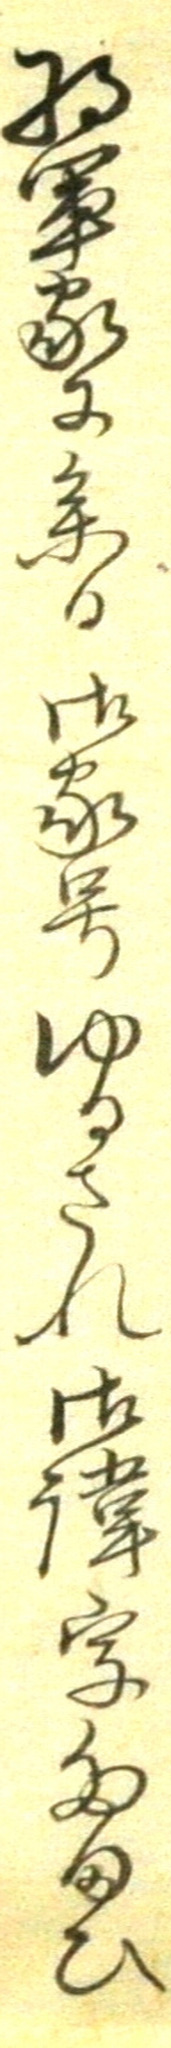将軍家に参る御家号ゆるされ御諱字たまひ
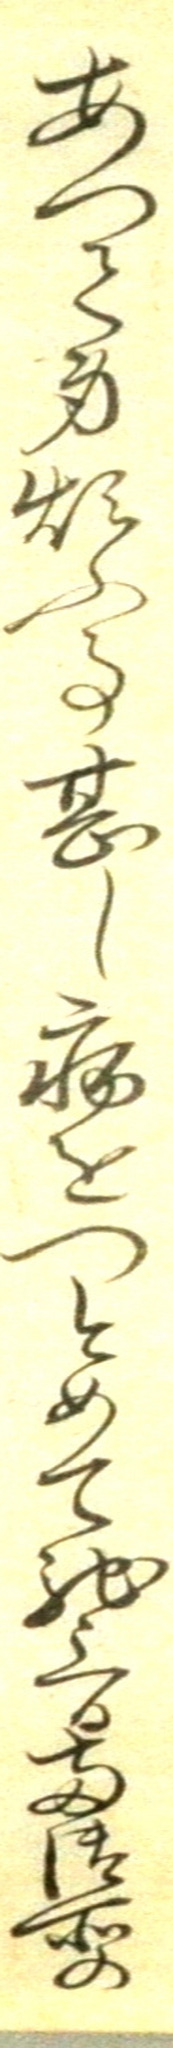あつて身煩ふ事甚し病をつとめて馳上る両御所の
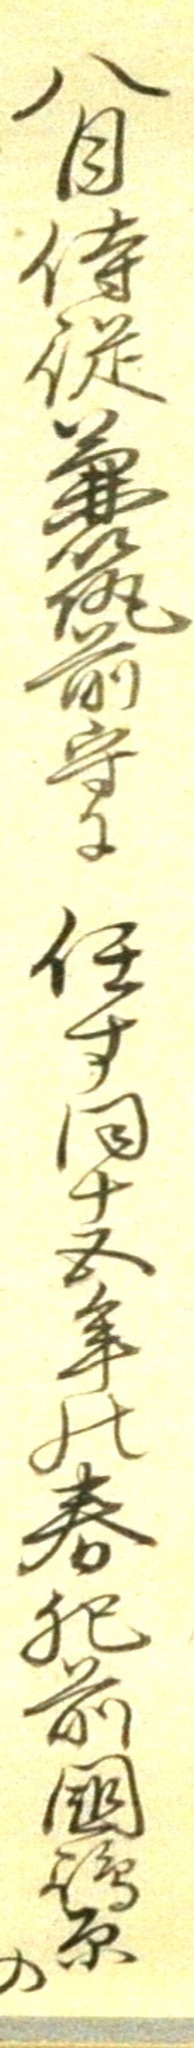八月侍従兼筑前守に任す同十五年の春肥前国島原の
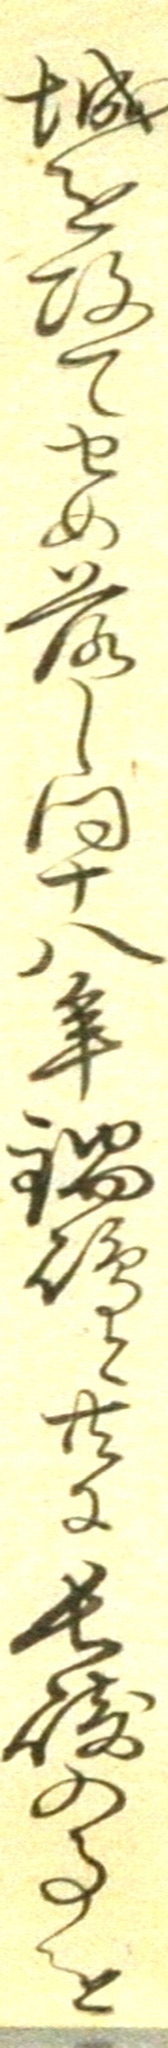城を攻てせめ落し同十八年鍋島と共に長崎の事を
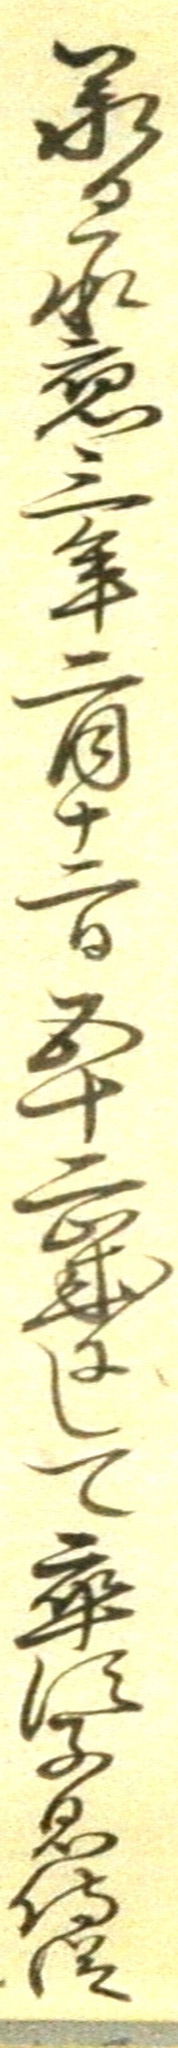承る承応三年二月十二日五十二歳にして卒す子息侍従
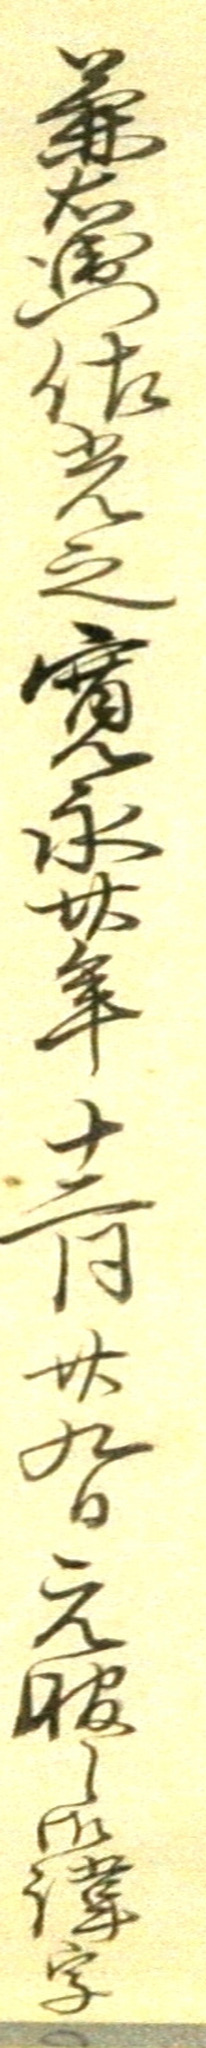兼右衛門佐光之寛永廿年十二月廿九日元服し御諱字
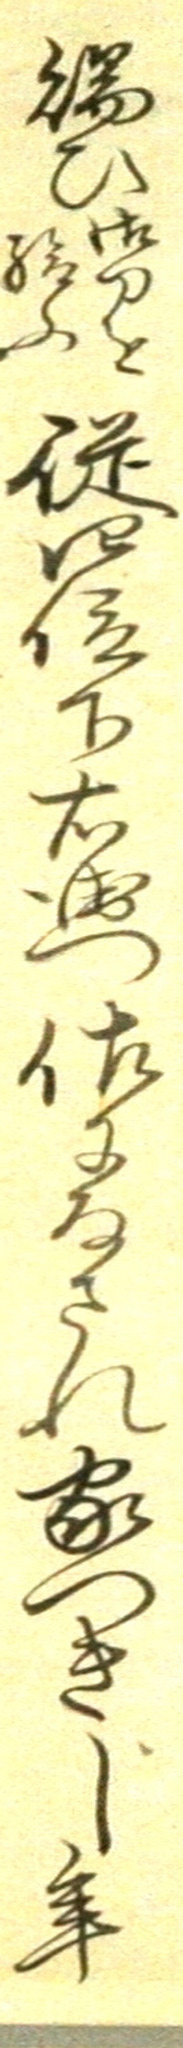賜ひ御刀を給ふ従四位下右衛門佐になされ家つきし年
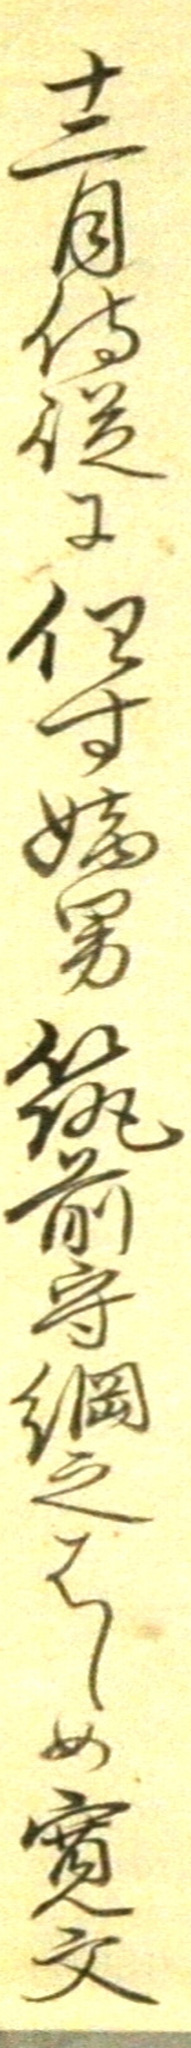十二月侍従に任す嫡男筑前守綱之はしめ寛文
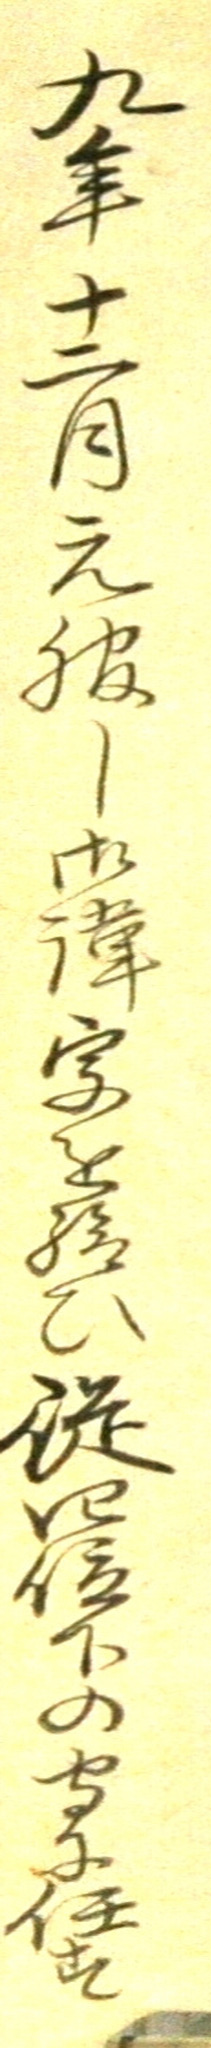九年十二月元服し御諱字を給ひ従四位下の守に任す
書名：藩翰譜（七・上）
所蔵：伊那市立高遠町図書館・合同会社AMANE
